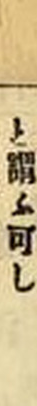と謂ふ可し
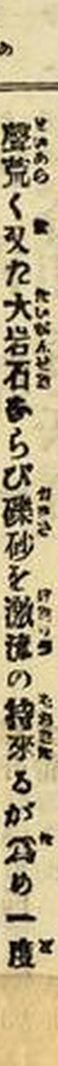聲荒く又た大岩石ならび礫砂を激流の持來るが爲め一度
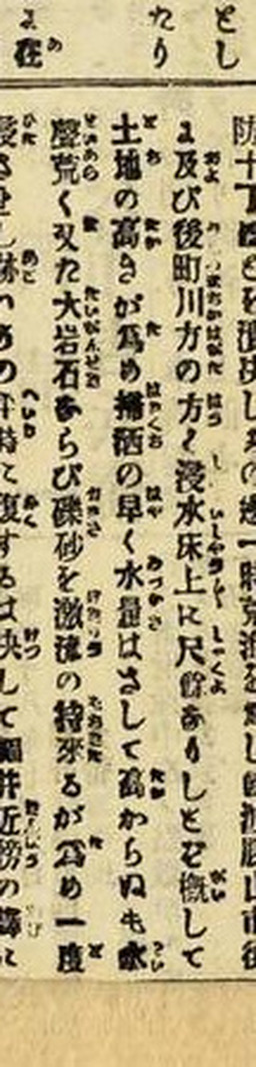土地の高きが爲め掃洒の早く水量はさして高からぬも水
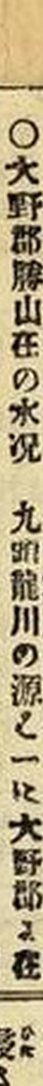○大野郡勝山在の水況九頭龍川の源は一に大野郡に在
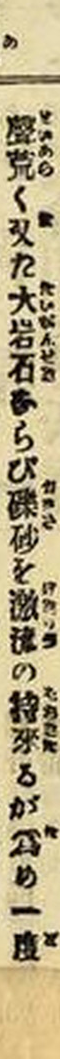聲荒く又た大岩石ならび礫砂を激流の持來るが爲め一度
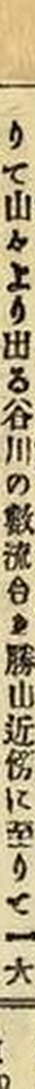りて山々より出る谷川の數流合し勝山近傍に至りて一大
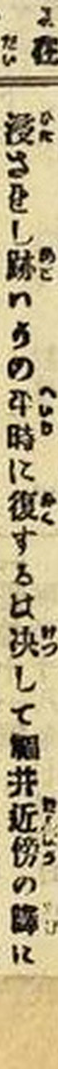浸されし跡はかの平時に復するは決して福井近傍の譯に
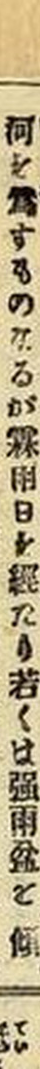河を爲すものなるが霖雨日を經たり若くは强雨盆を傾
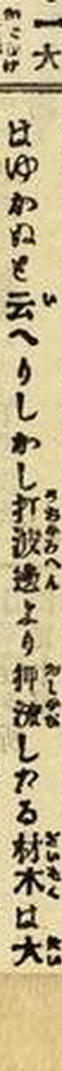はゆかねと云へりしかし打波邊より押流したる材木は大
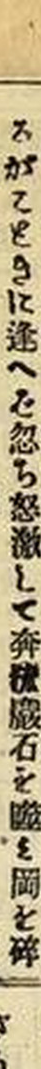るがこときに逢へば忽ち怒激して奔流巖石を嚙み岡を碎
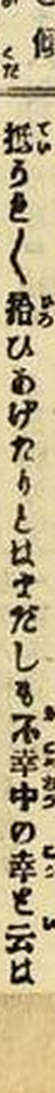抵それ〳〵拾ひあげたりとはまだしも不幸中の幸と云は
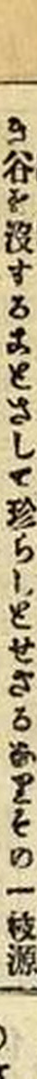き谷を沒することさして珍らしとせざるなりその一枝源
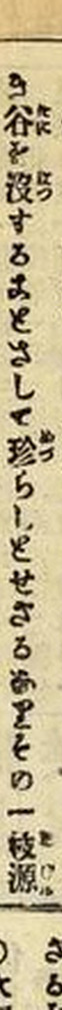き谷を沒することさして珍らしとせざるなりその一枝源
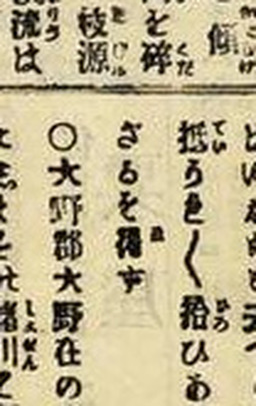ざるを得す
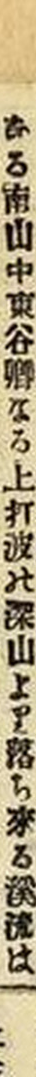なる南山中東谷鄕なる上打波の深山より落ち來る溪流は
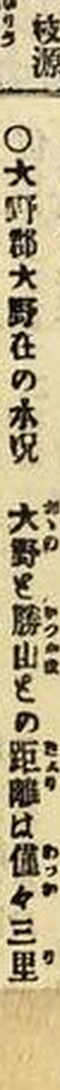○大野郡大野在の水況大野と勝山との距離は僅々三里
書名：温古集 五巻
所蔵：福井県文書館 Fukui Prefectural Archives
